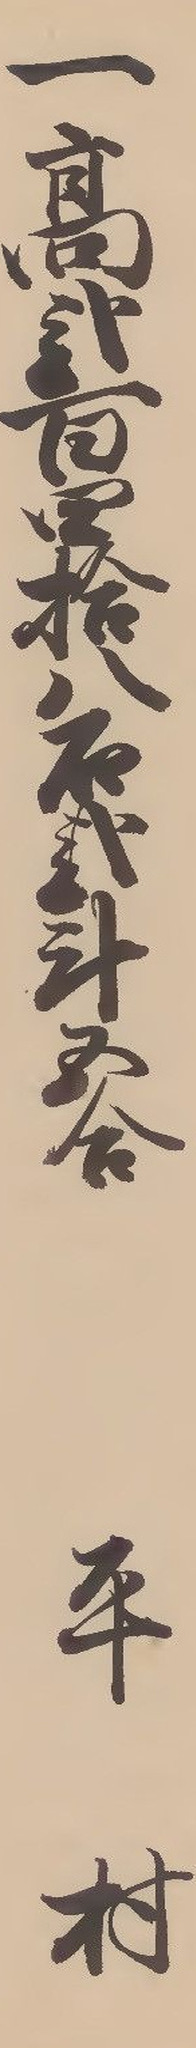一高弐百四拾八石弐斗五合平村
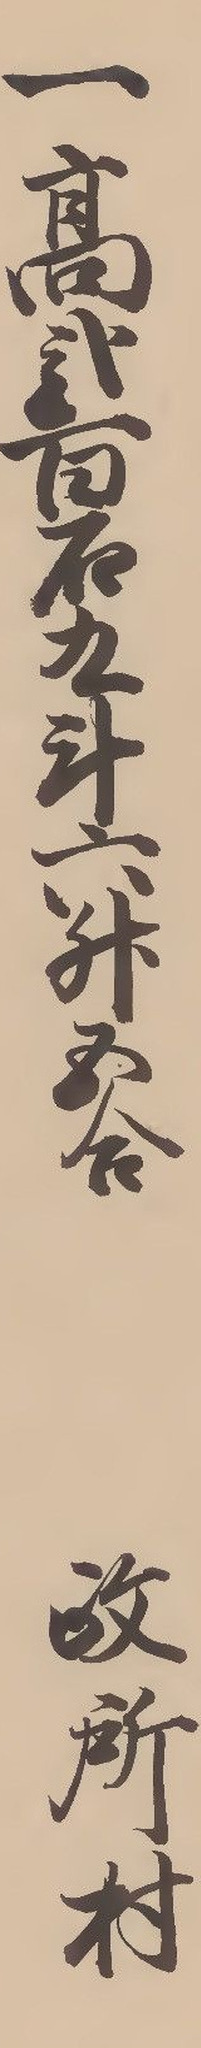一高弐百石九斗六升五合政所村
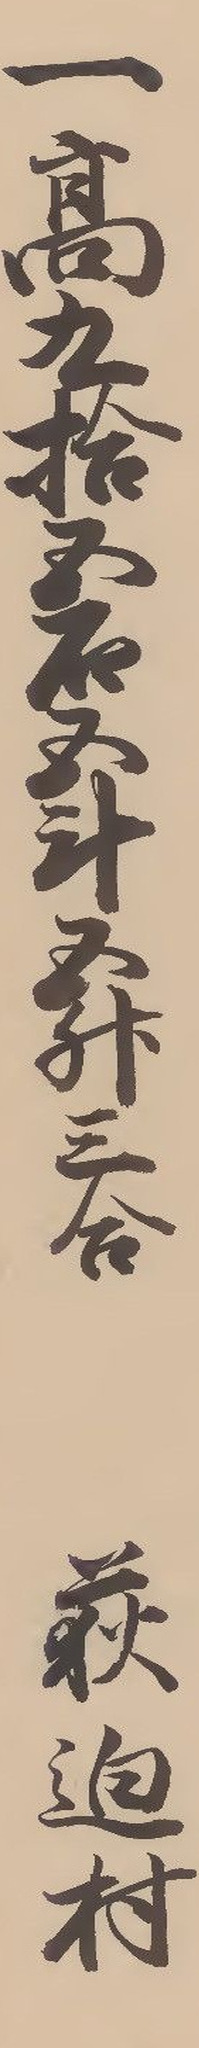一高九拾五石五斗五升三合萩迫村

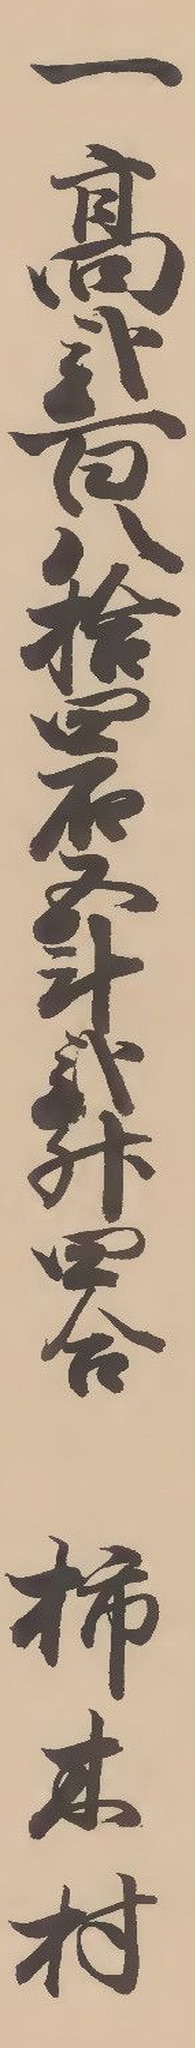一高弐百八拾四石五斗弐升四合柿木村
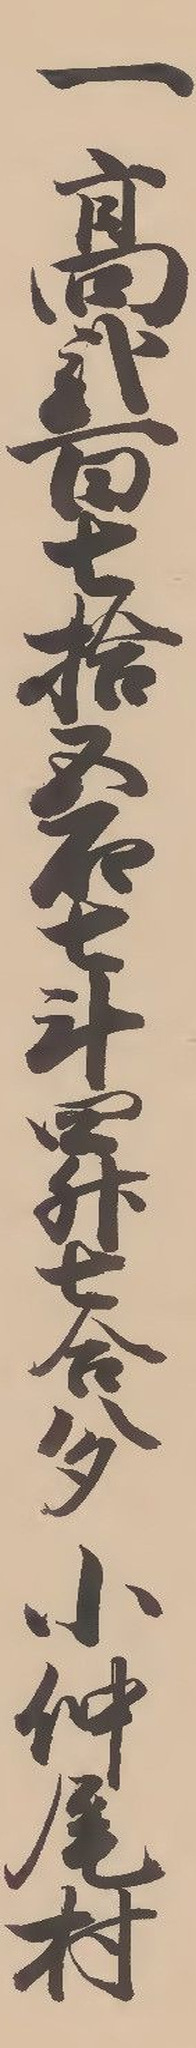一高弐百七拾五石七斗四升七合八勺小仲尾村
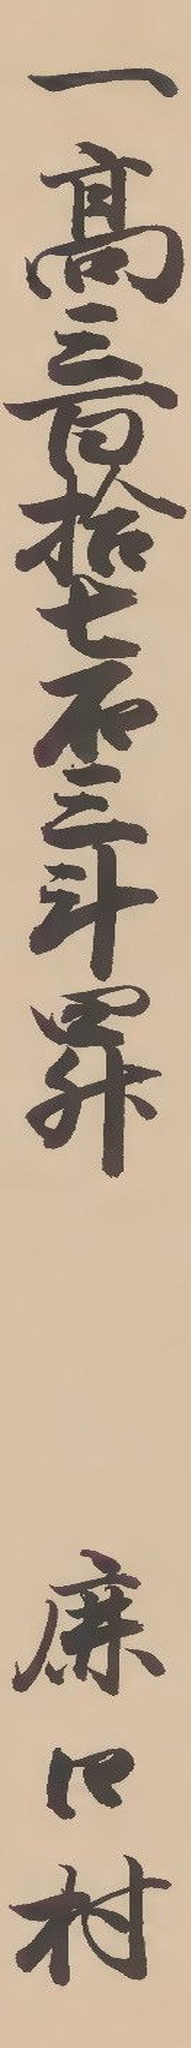一高三百拾七石三斗四升鹿口村
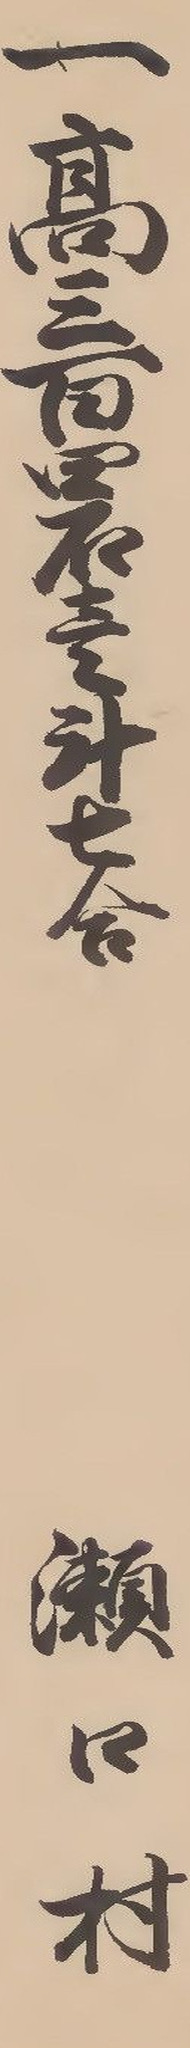一高三百四石壱斗七合瀬口村
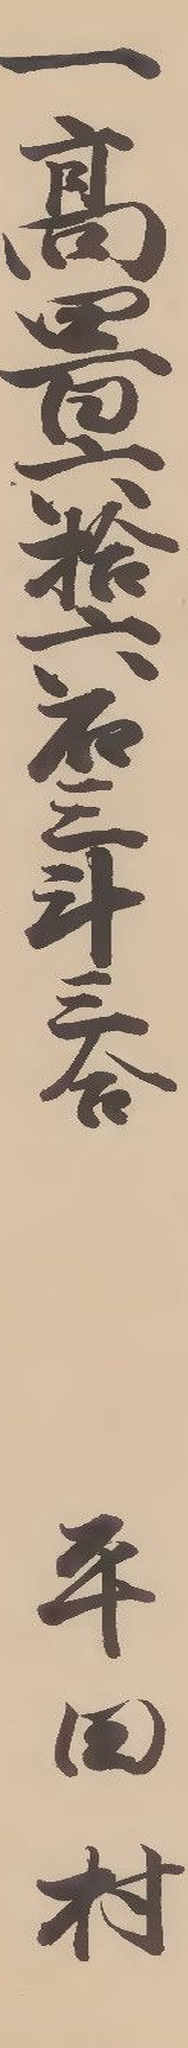一高四百六拾六石三斗三合平田村
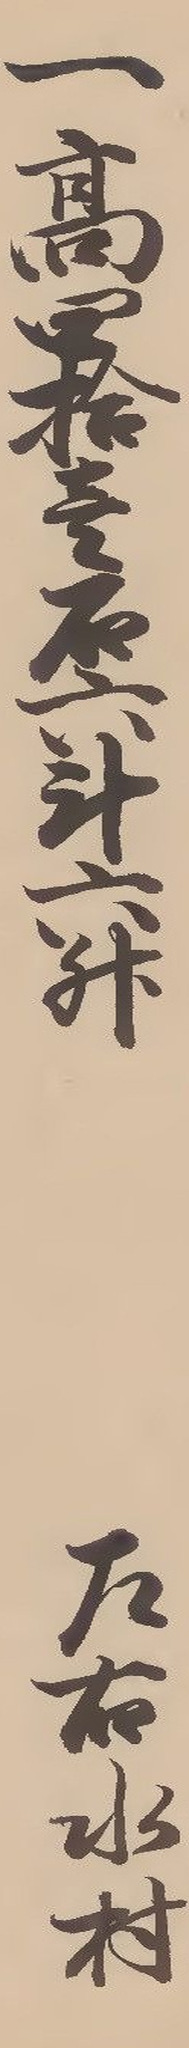一高四拾壱石六斗六升左右水村
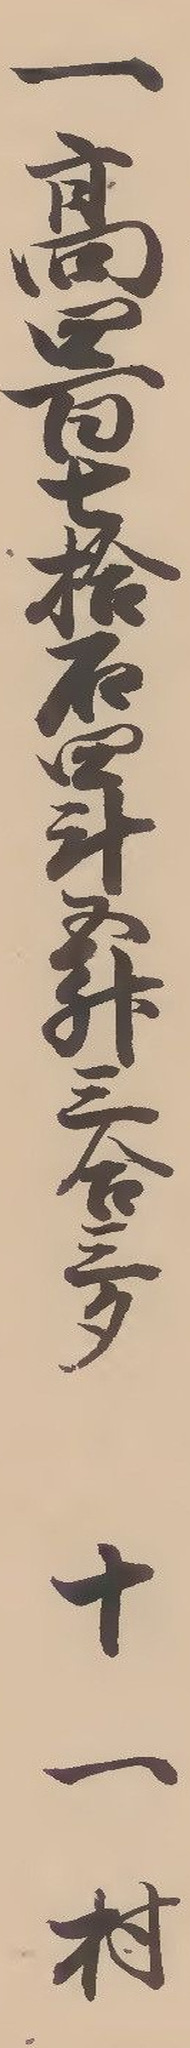一高四百七拾石四斗五升三合三勺十一村

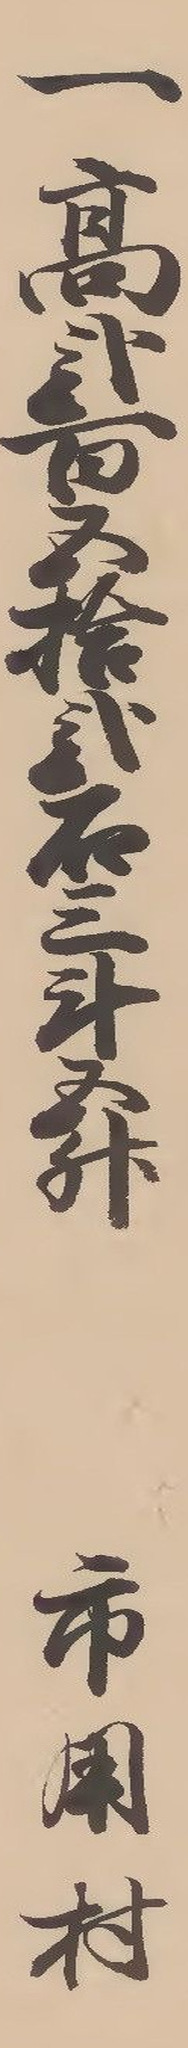一高弐百五拾弐石三斗五升市用村
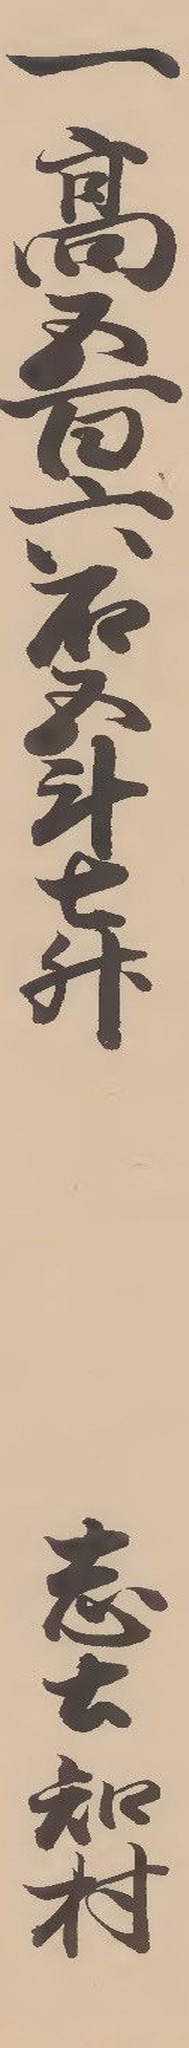一高五百六石五斗七升志土知村
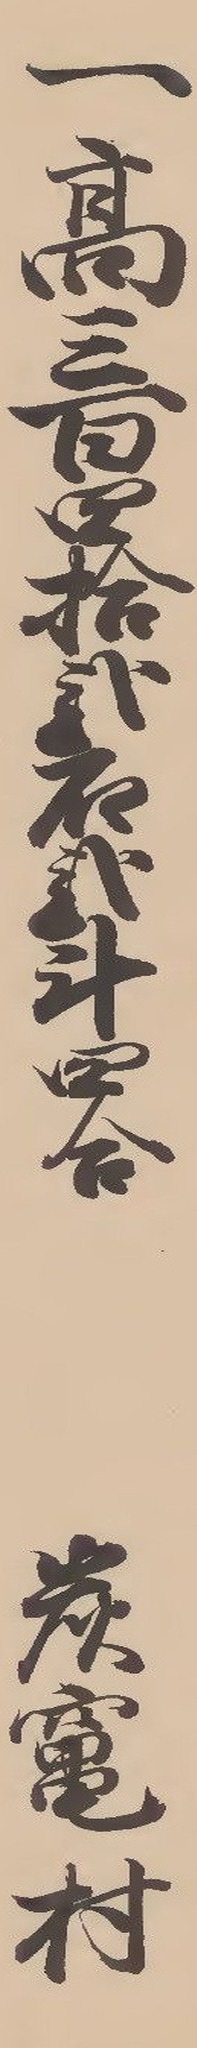一高三百四拾弐石弐斗四合炭竃村
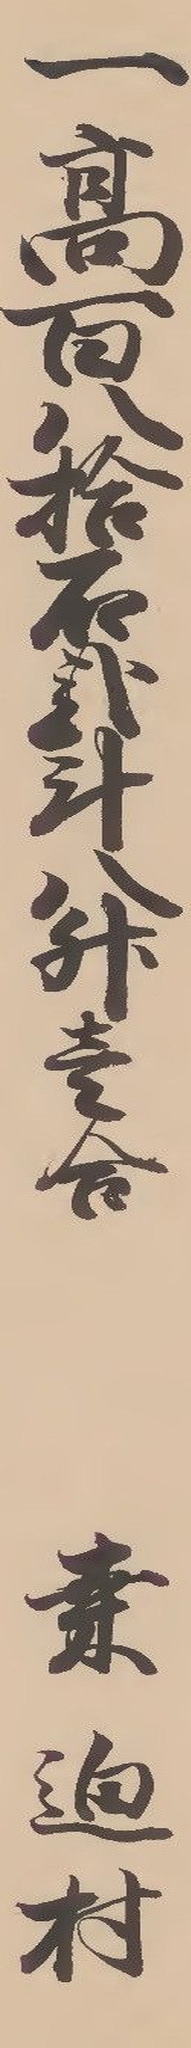一高百八拾石弐斗八升壱合桑迫村
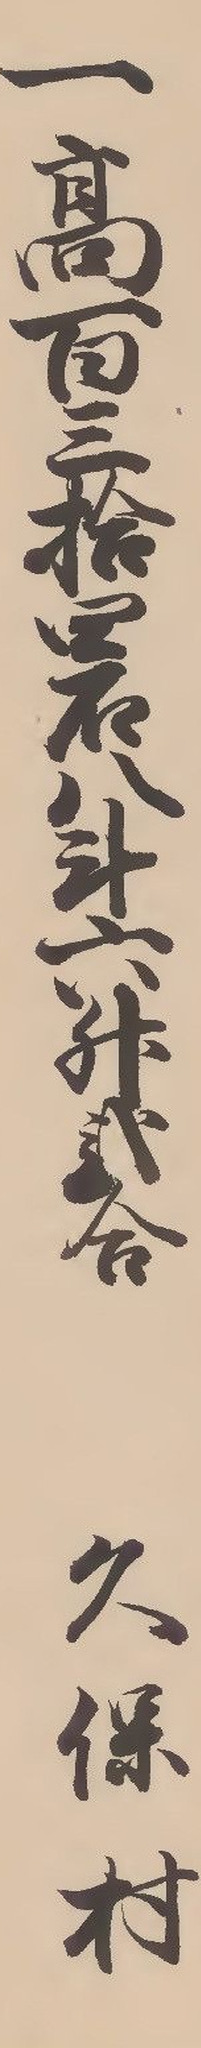一高百三拾四石八斗六升弐合久保村
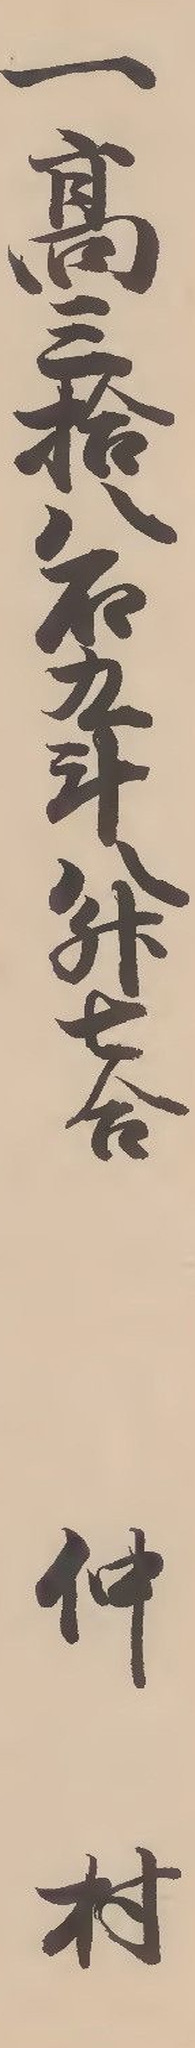一高三拾八石九斗八升七合仲村
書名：豊後国郷帳
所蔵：国立公文書館 National Archives of Japan
